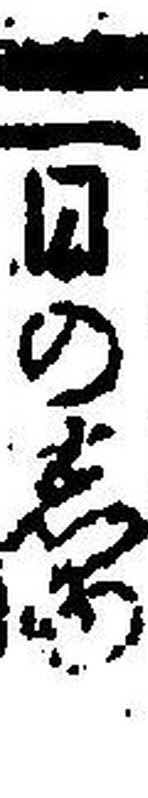一日のしゆ
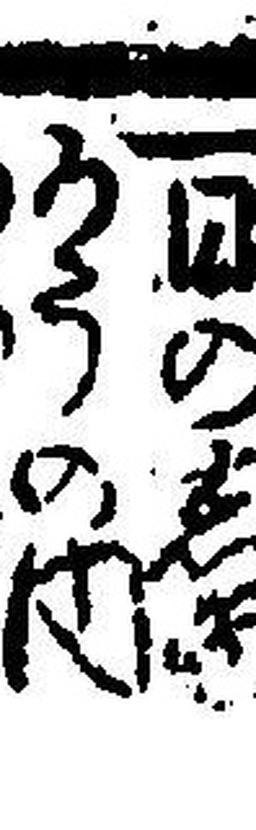かうの内
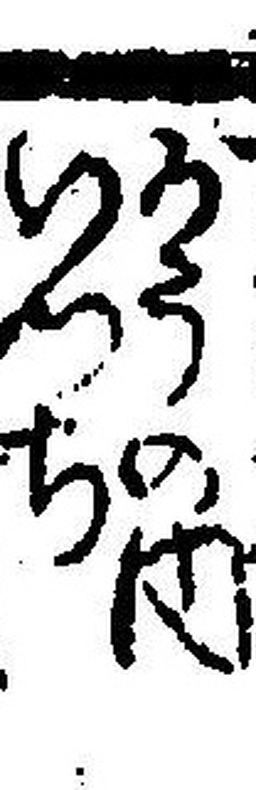いつち
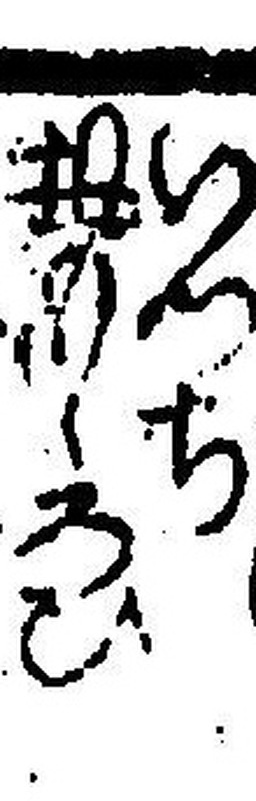おもしろひ
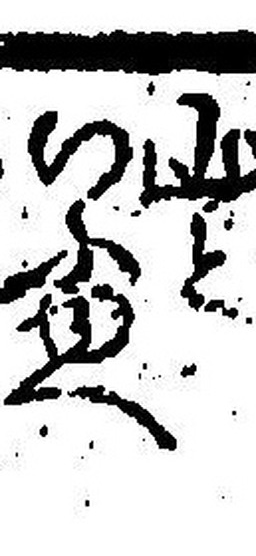いふゆへ
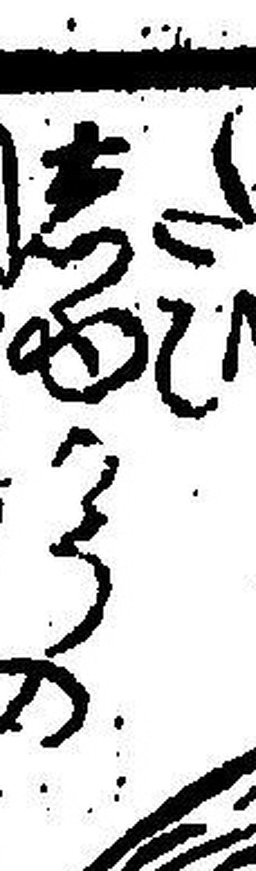しゆかうの
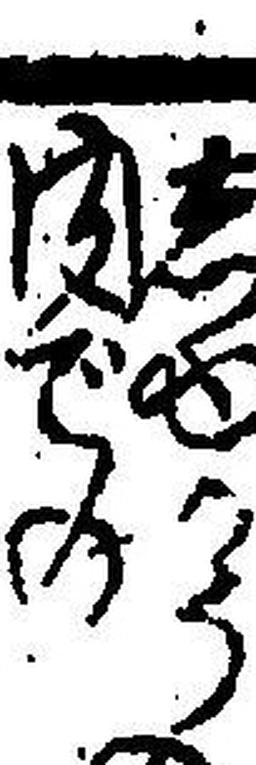内での
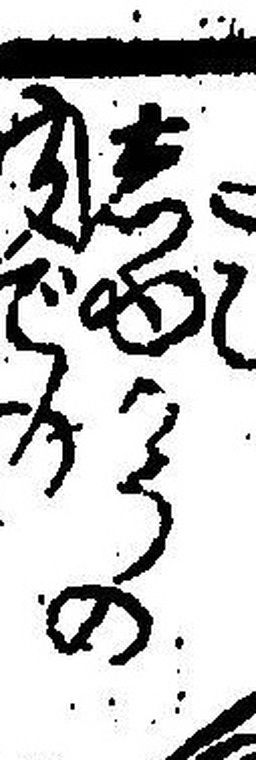しゆかうの
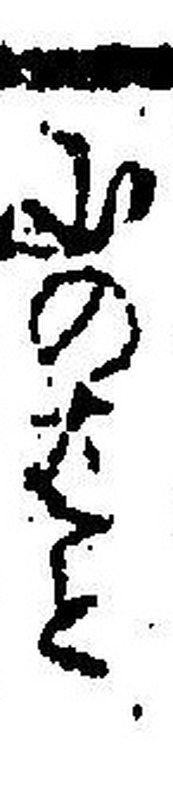山のばと
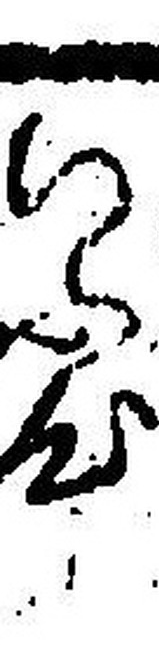いふ心
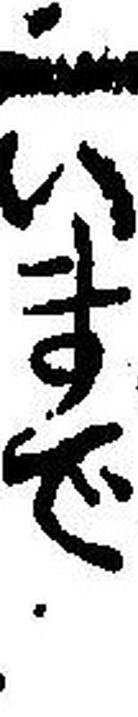いまで
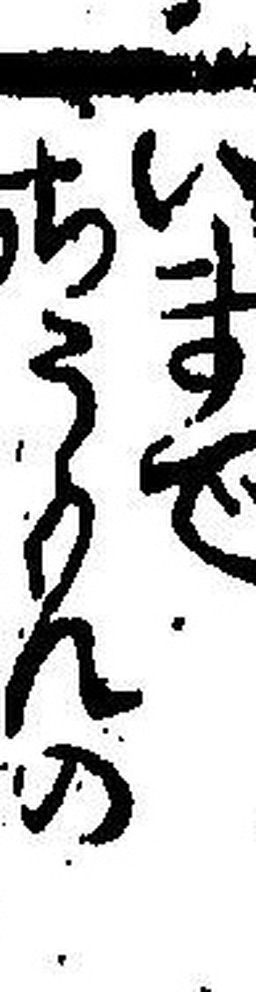ちうもんの
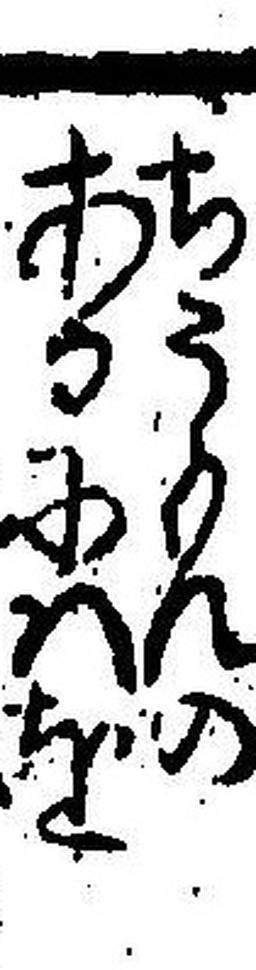あるにはを
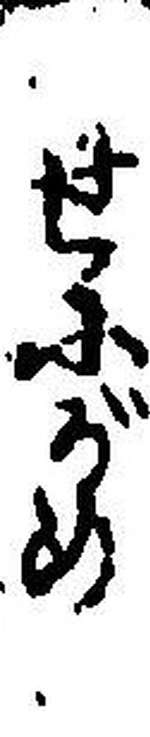せにがめ
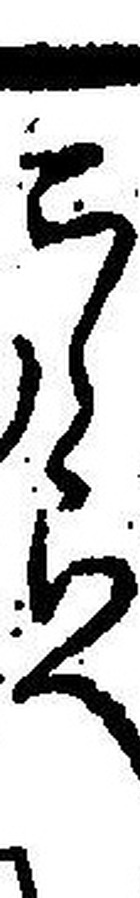こしらへ
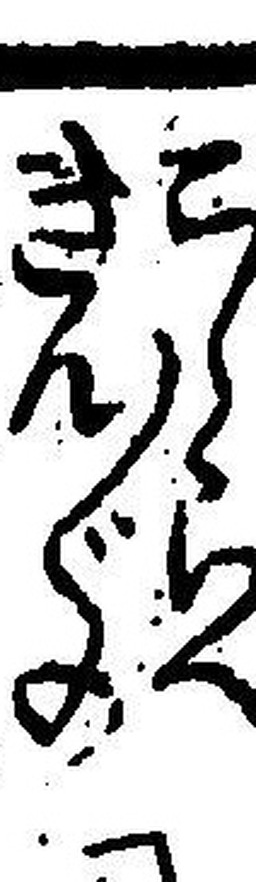きん〴〵の
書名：徳若水縁起金性 / 樹下石上作
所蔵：東京大学総合図書館 General Library in the University of Tokyo, JAPAN
